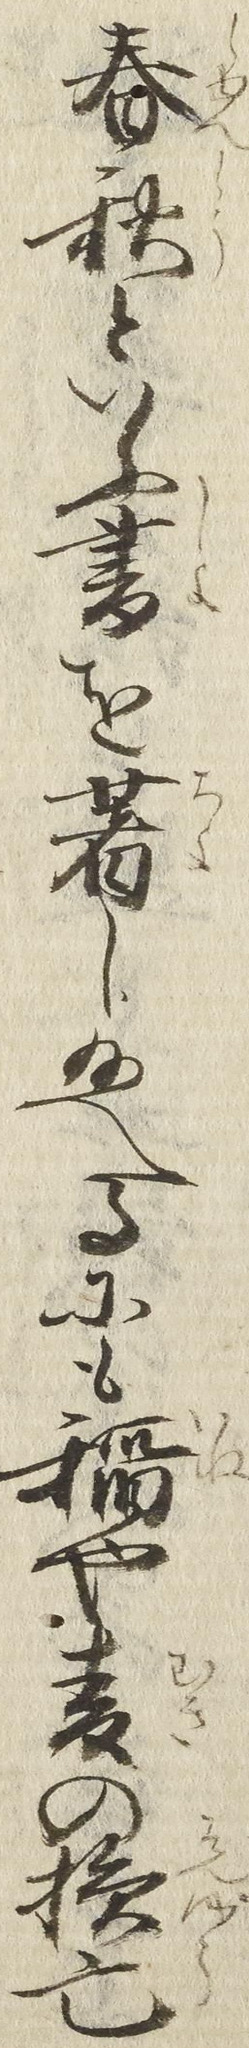春秋といふ書を著し給へるにも稲や麦の損亡
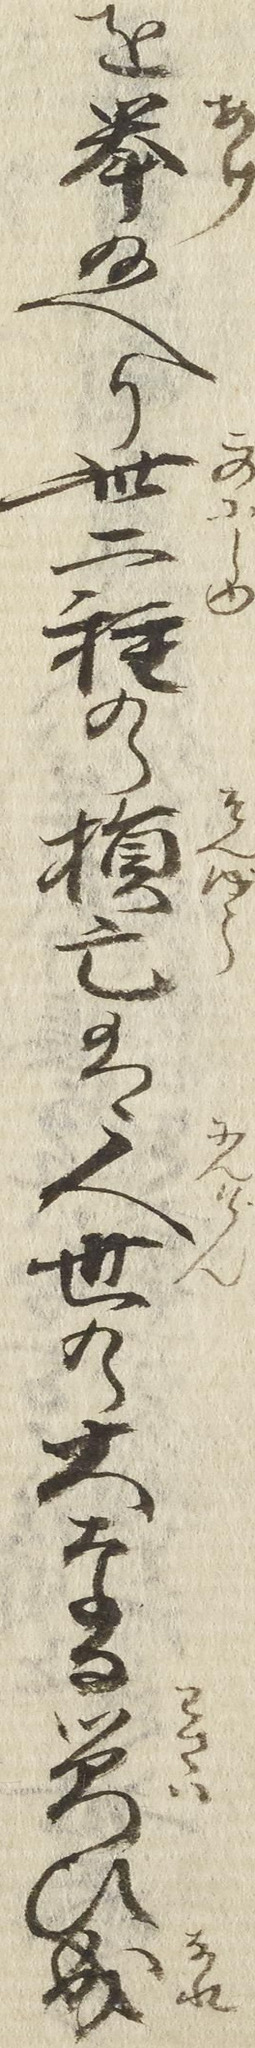を挙給へり此二種の損亡は人世の大なる災ひ成
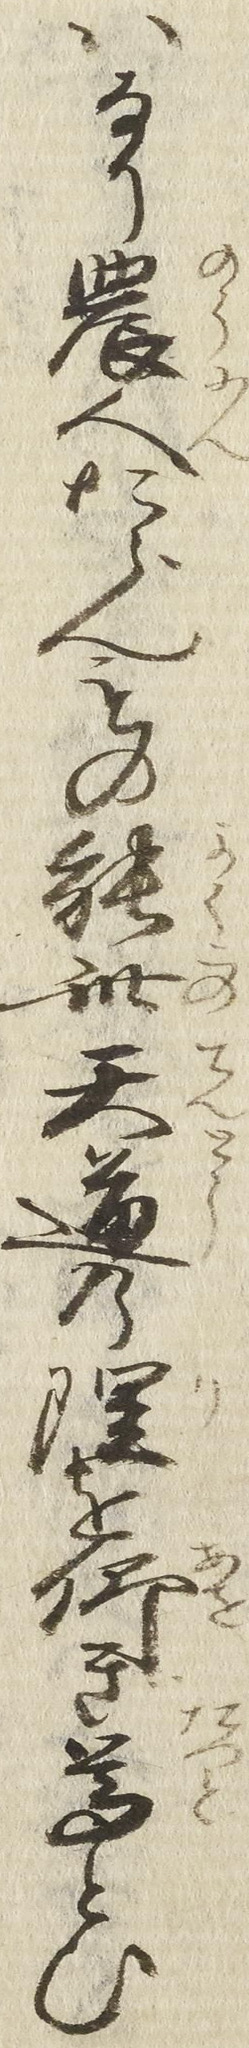はなり農人たらんもの能此天道の理を仰き尊とひ
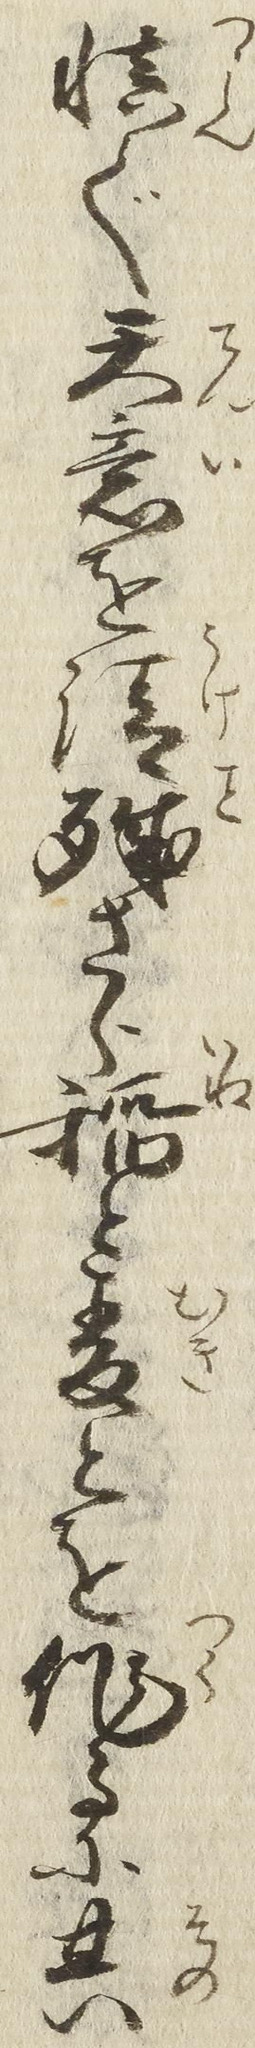慎で天意を請殊さら稲と麦とを作るに其
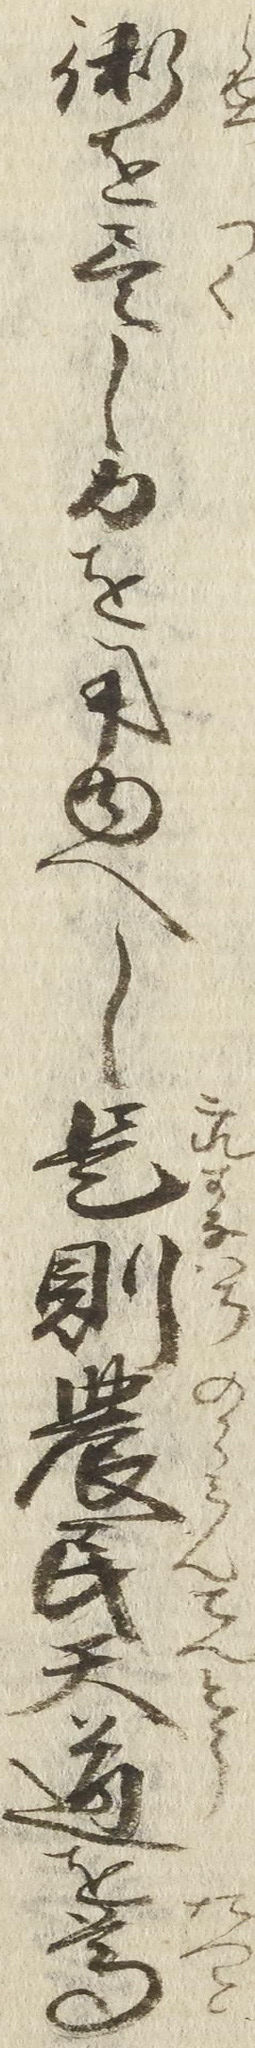術を尽し力を用ゆへし是則農民天道を尊
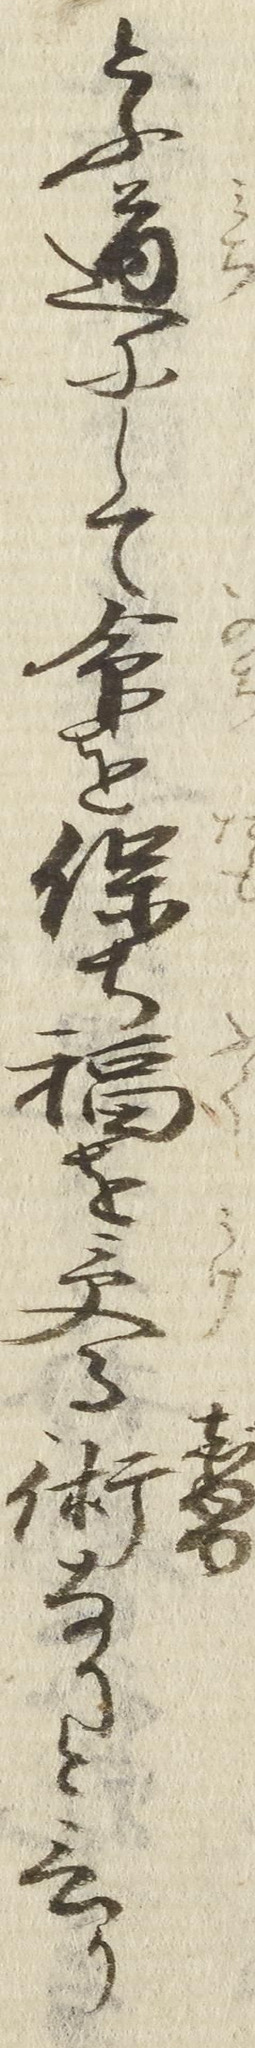とふ道にして命を保ち福を受る術なりと言り
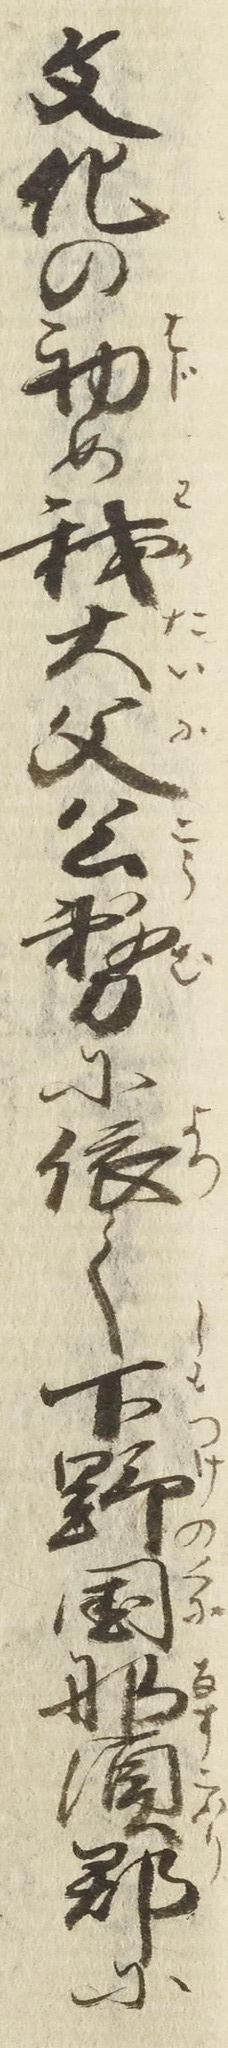文化の初め我大父公務に依て下野国那須郡に
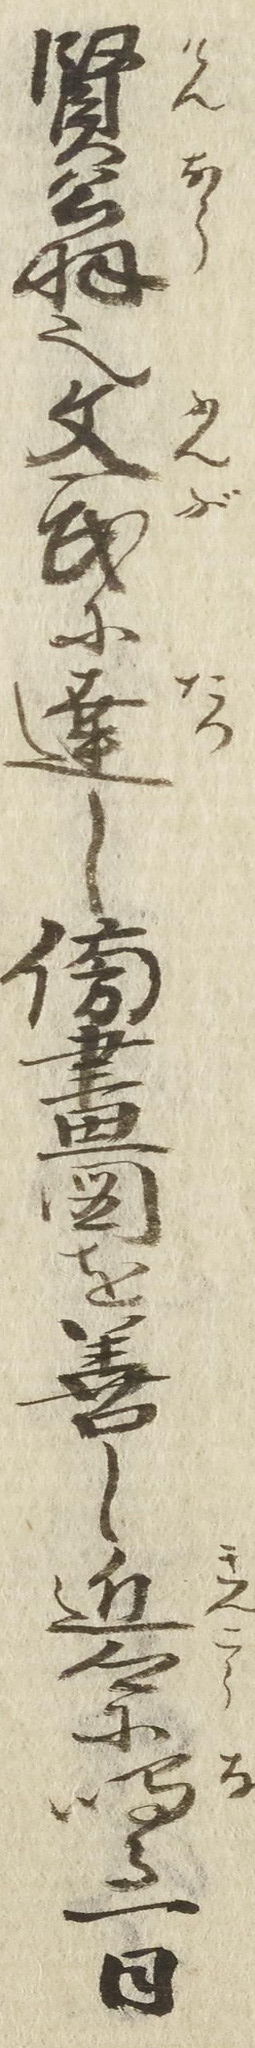賢翁也文武に達し傍図画を善し近郷に鳴る一日
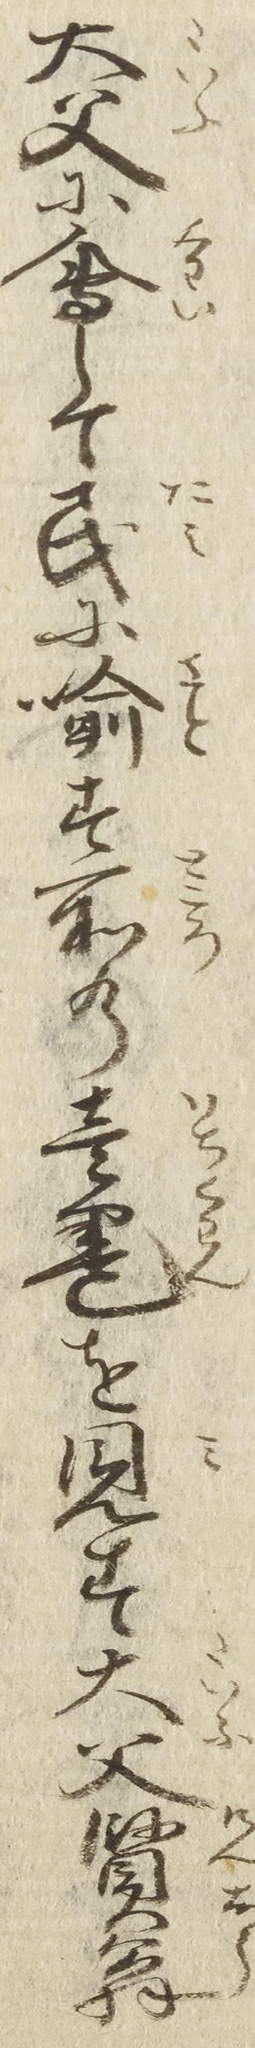大父に会して民に諭す所の一巻を見す大父賢翁
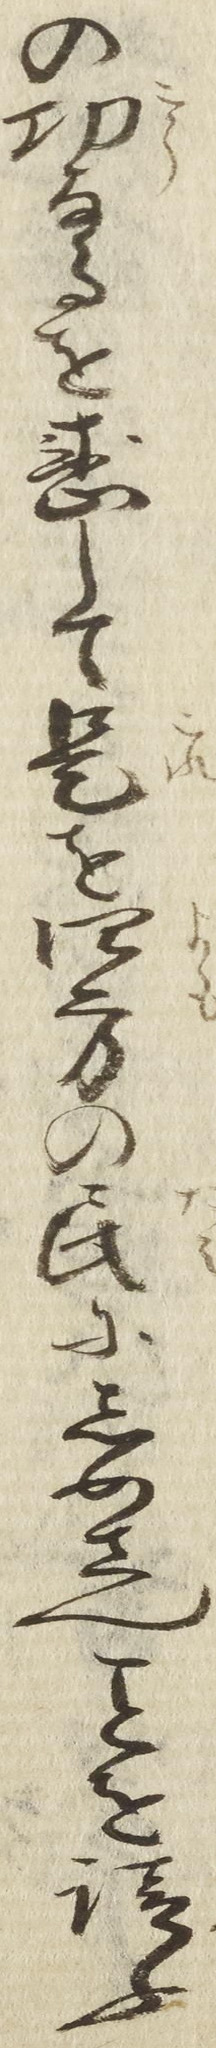の功なるをして是を四方の民にしめさんことを請ふ
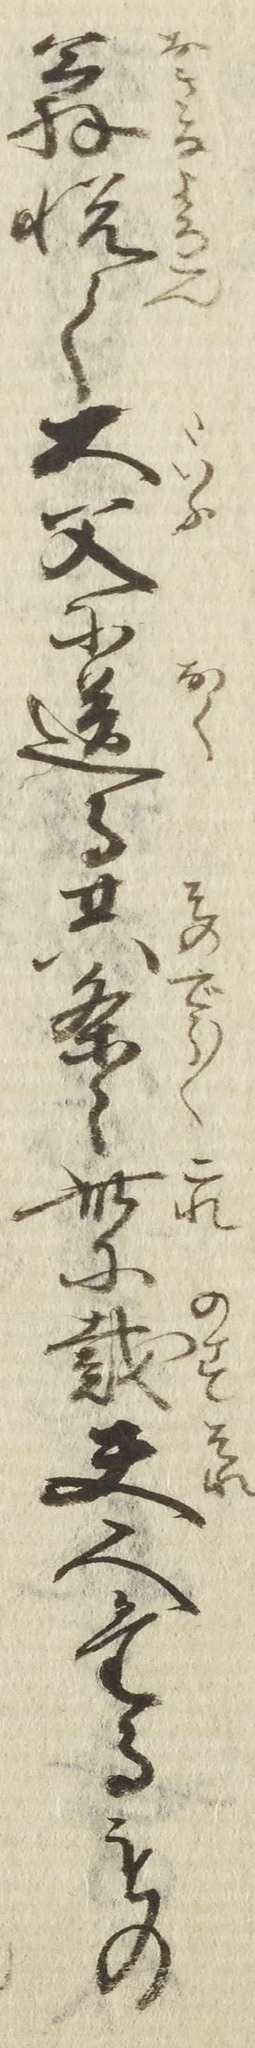翁悦て大父に送る其条〻此に載夫人たるもの
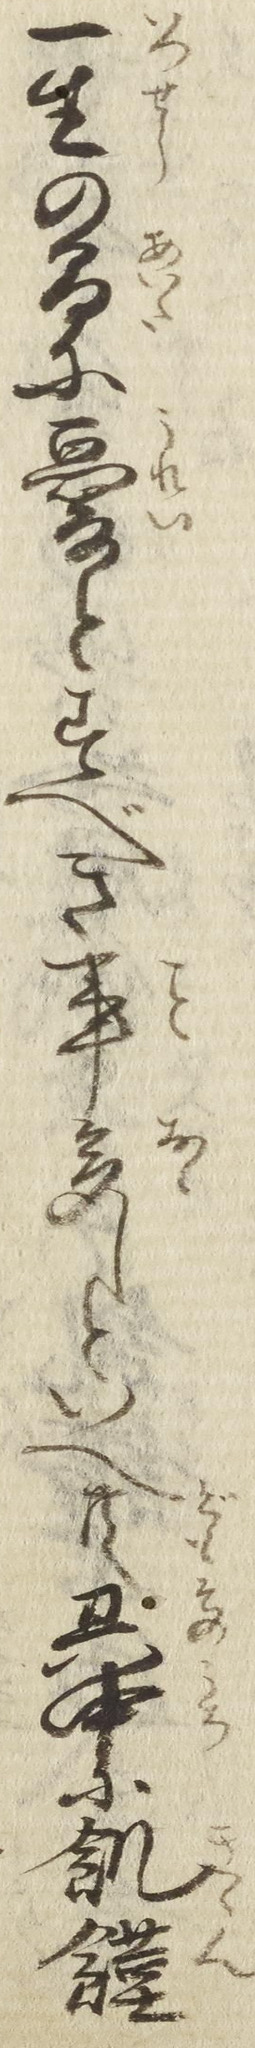一生の間に憂とすべき事多しといへ共其中に飢饉
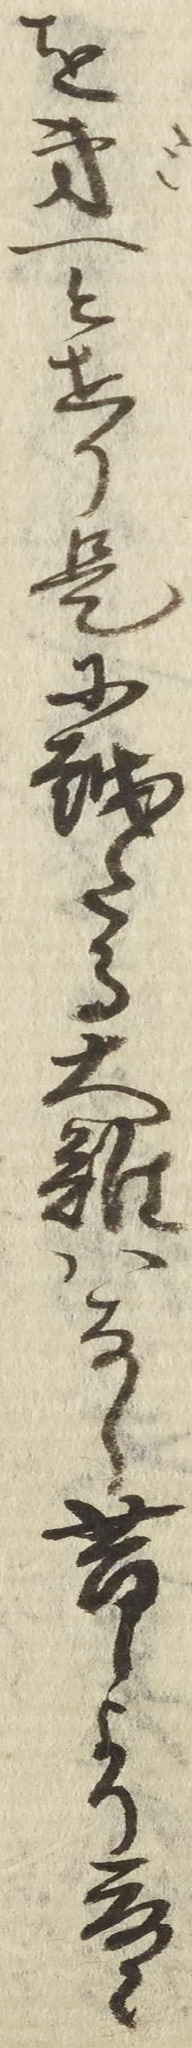を第一とせり是に越たる大難はなし昔しより度〻

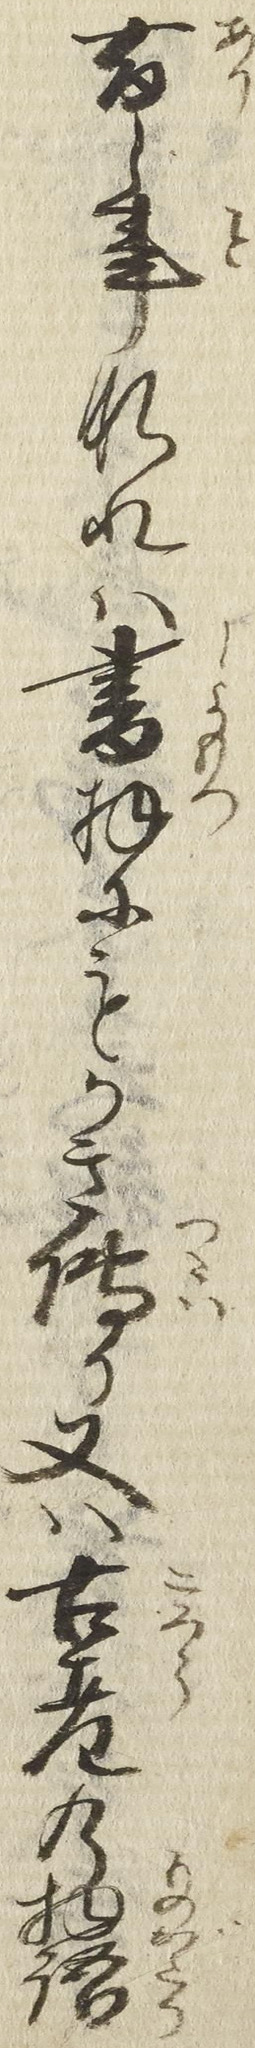有し事なれは書物にもかき伝り又は古老の物語
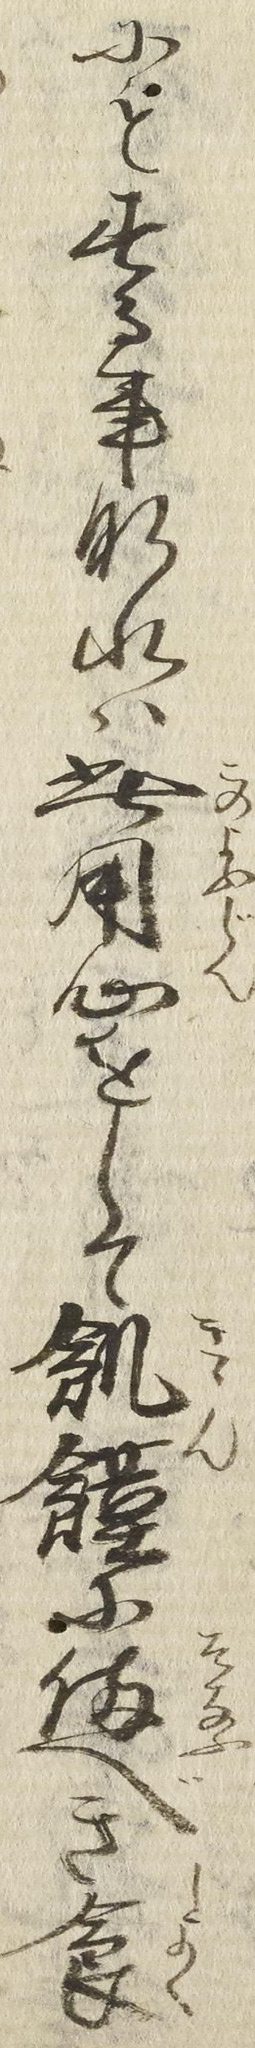にもする事なれは此用心をして飢饉に備べき食
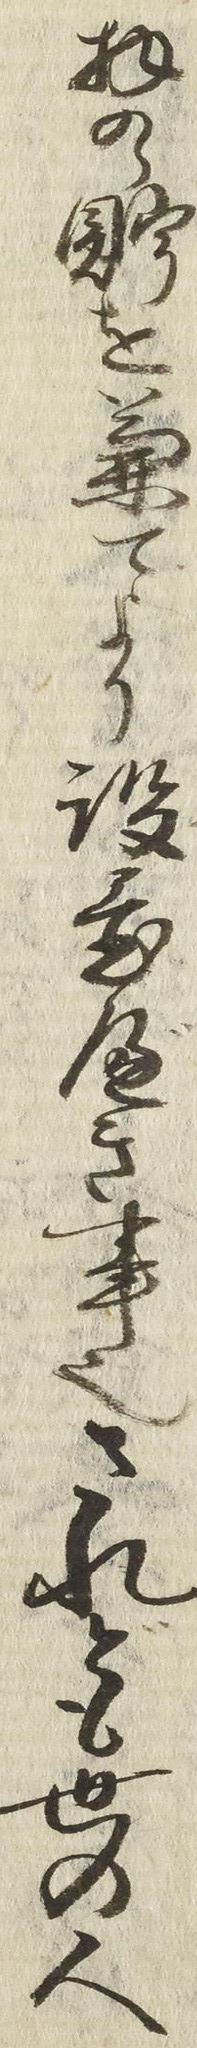物の貯を兼てより設置べき事也されども世の人
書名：天明奇畧　全
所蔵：東京大学地震研究所図書室 Earthquake Research Institute Library, The University of Tokyo, JAPAN
